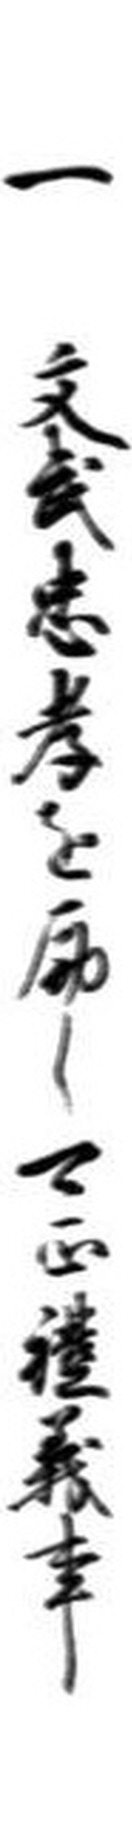一文武忠孝を励し可正礼義事

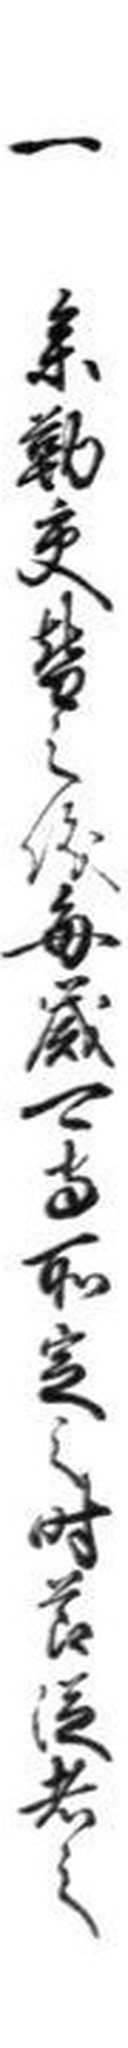一参勤交替之儀毎歳可守所定之時節従者之
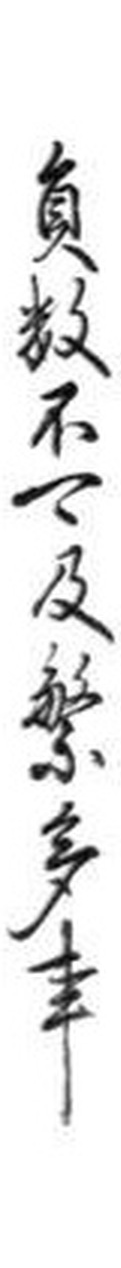員数不可及繁多事
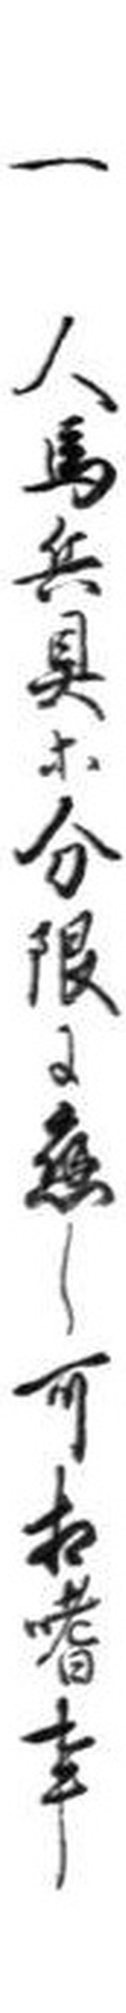一人馬兵具等分限に応し可相嗜事
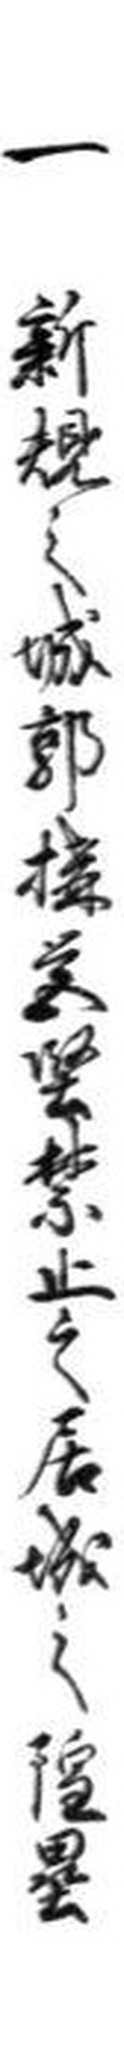一新規之城郭構営堅禁止之居城之隍塁
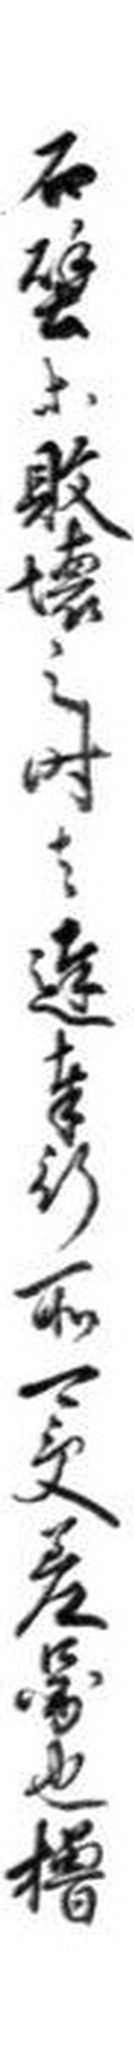石壁等敗壊之時者達奉行所可受差図也櫓
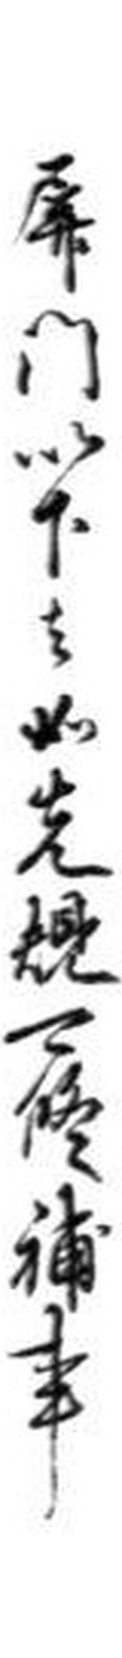屏門以下者如先規可修補事
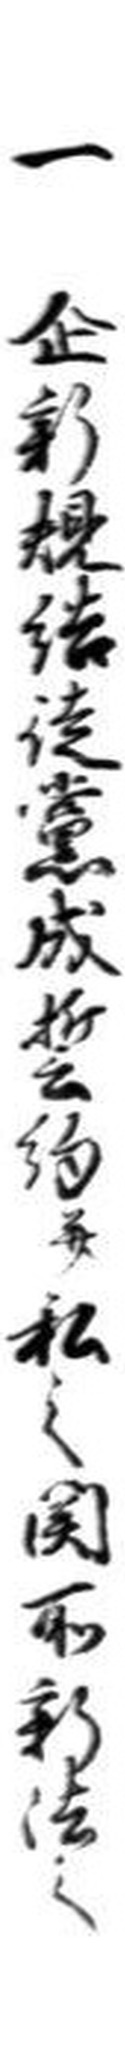一企新規結徒党成誓約并私之関所新法之
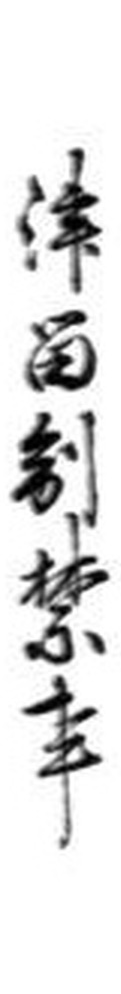津留制禁事
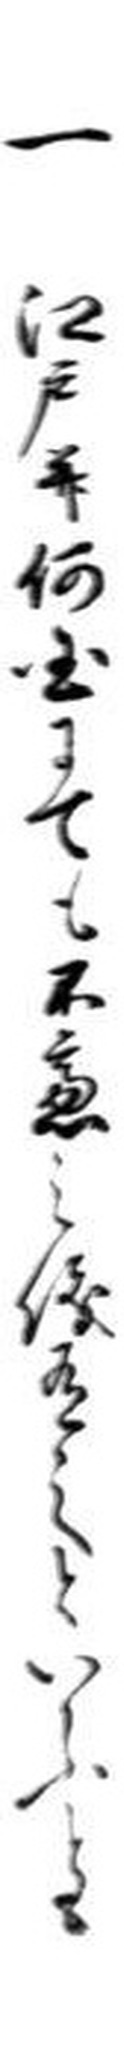一江戸并何国にても不慮之儀有之といふとも
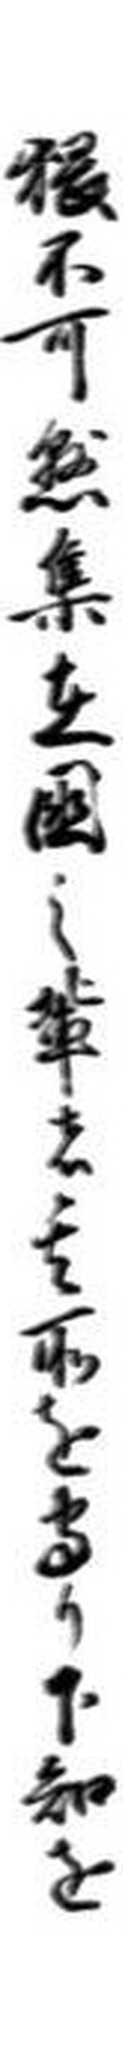猥不可懸集在国之輩者其所を守り下知を
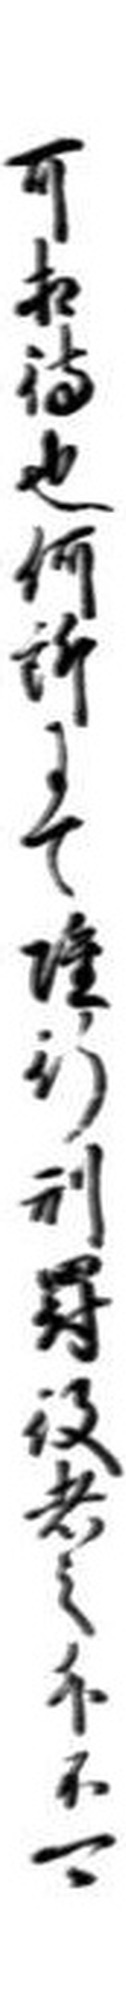可相待也何所にて雖行刑罸役者之外不可
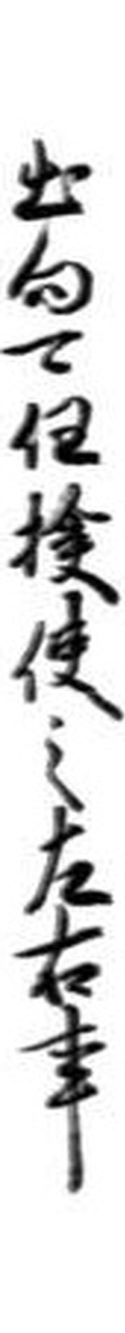出向可任検使之左右事
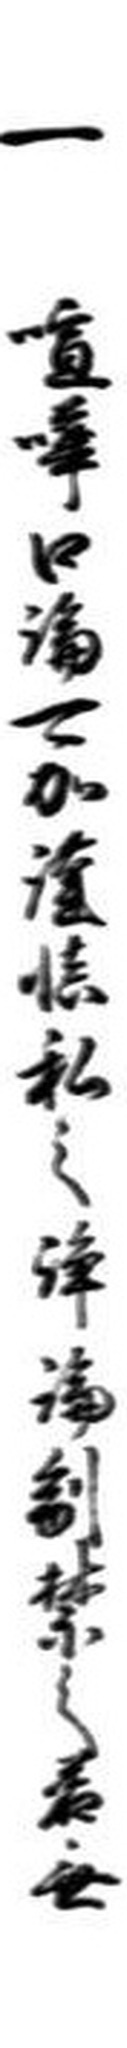一喧嘩口論可加謹慎私之諍論制禁之若無
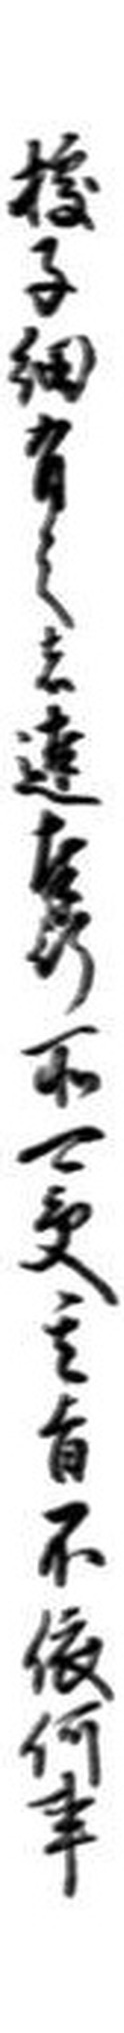拠子細有之者達奉行所可受其旨不依何事
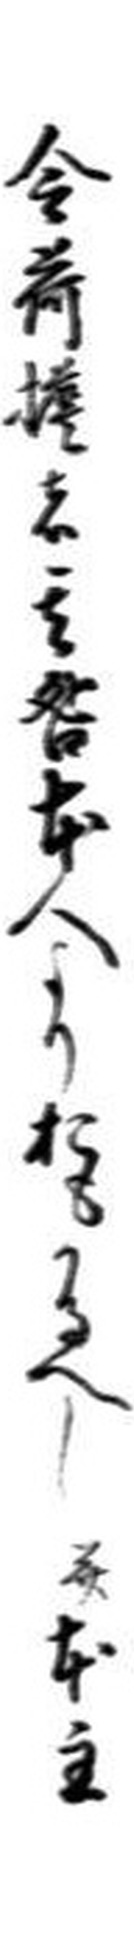令荷荷担者其咎本人よりおもかるへし并本主
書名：家譜 三十二 吉邦公 従享保二年到享保三年
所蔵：福井県文書館 Fukui Prefectural Archives
